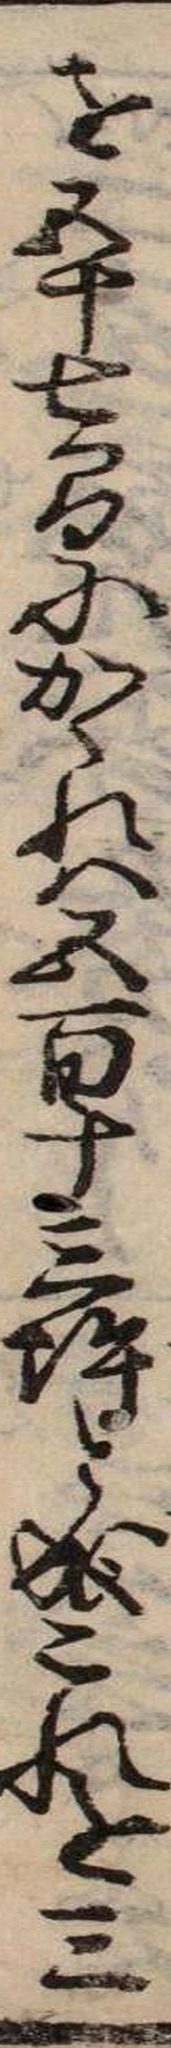を五十七間をかくれは五百十三坪と成これを三
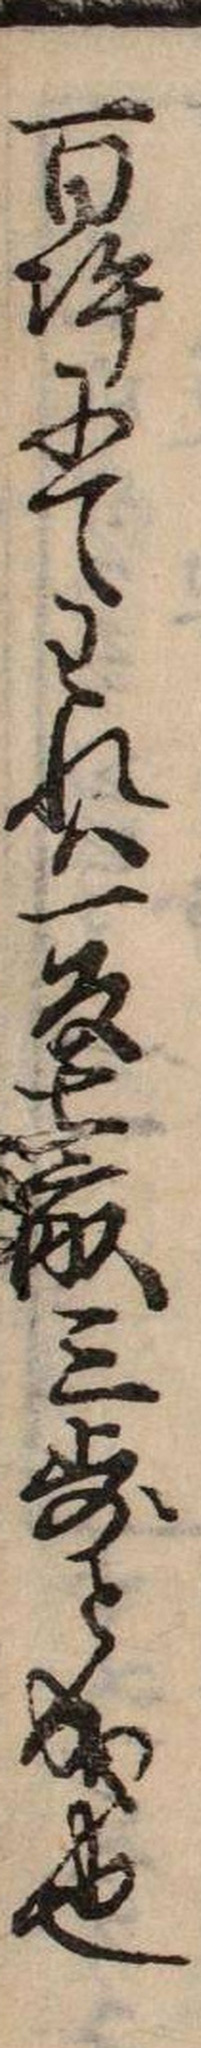百坪にてわれは一反七畝三歩と成也

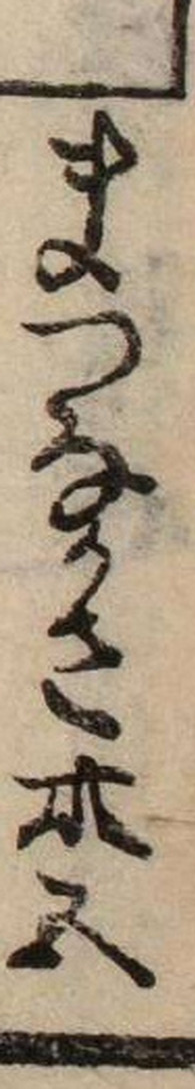まつなかさ丗五
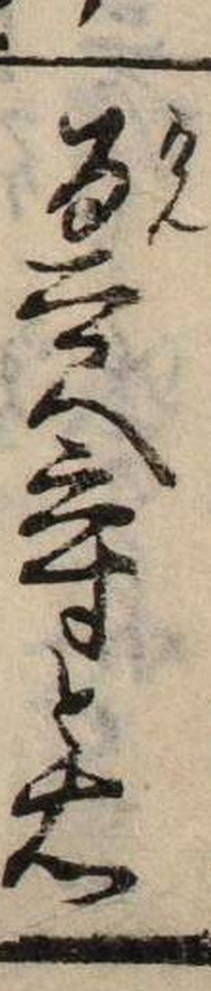間二尺六寸と右
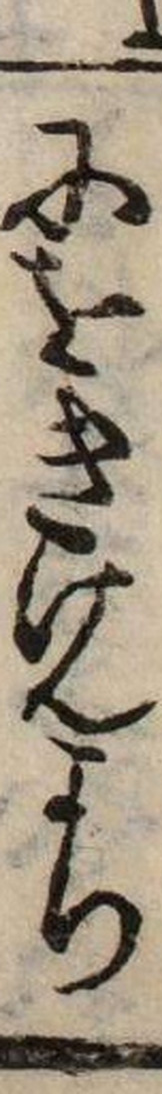にをきけんより
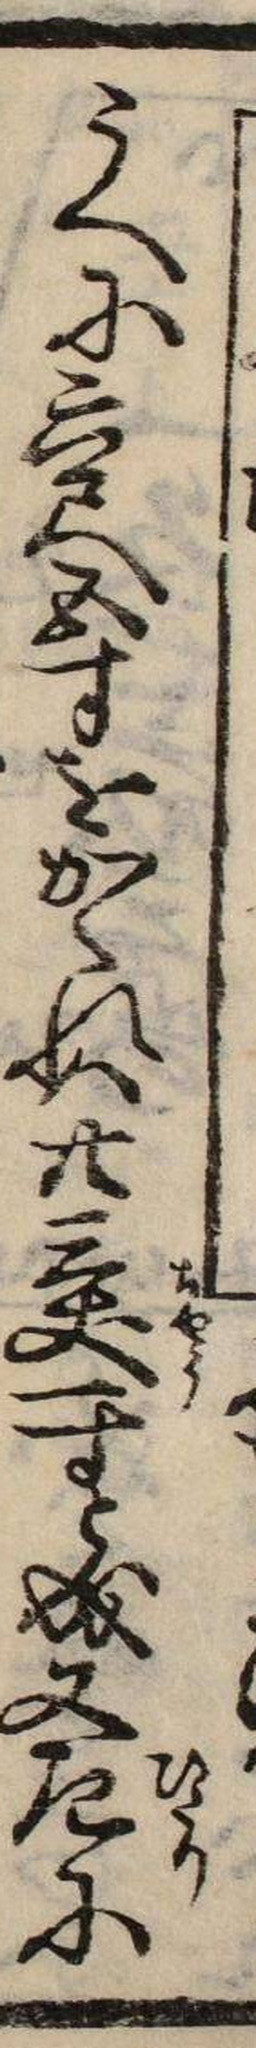うへに六尺五寸をかくれは廿三丈一寸と成又左に
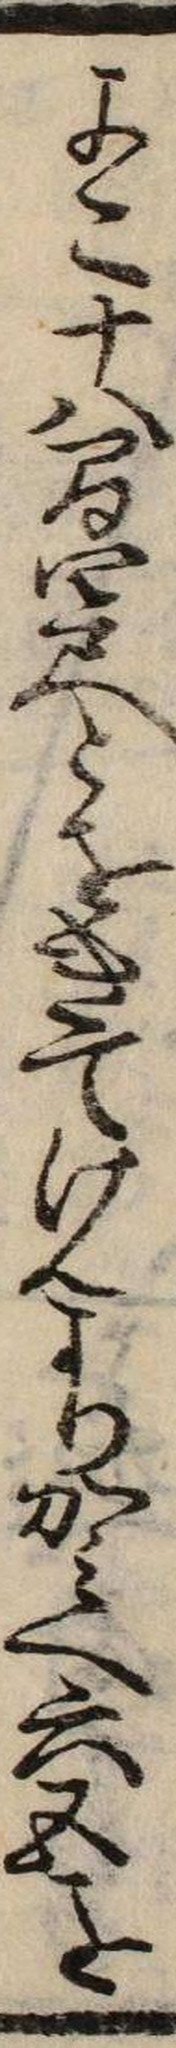よこ十八間四尺とをきてけんよりかみへ六尺を
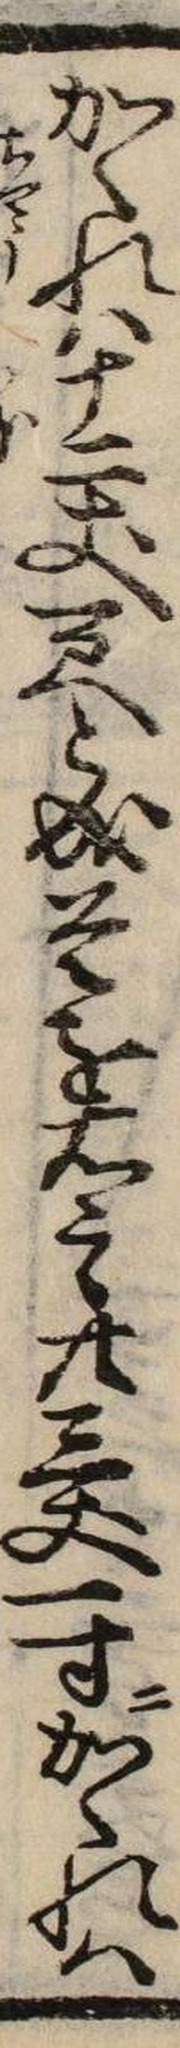かくれは十二丈一尺と成是を右の廿三丈一寸にかくれは
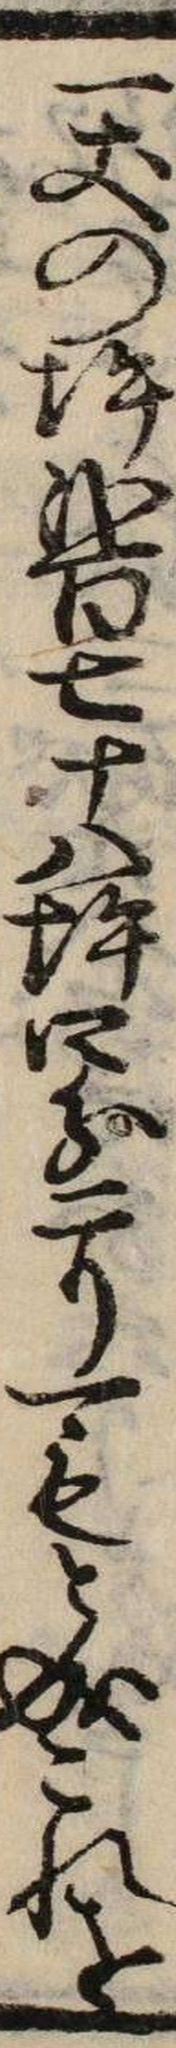一丈の坪弐百七十八坪四分二り一毛と成これを
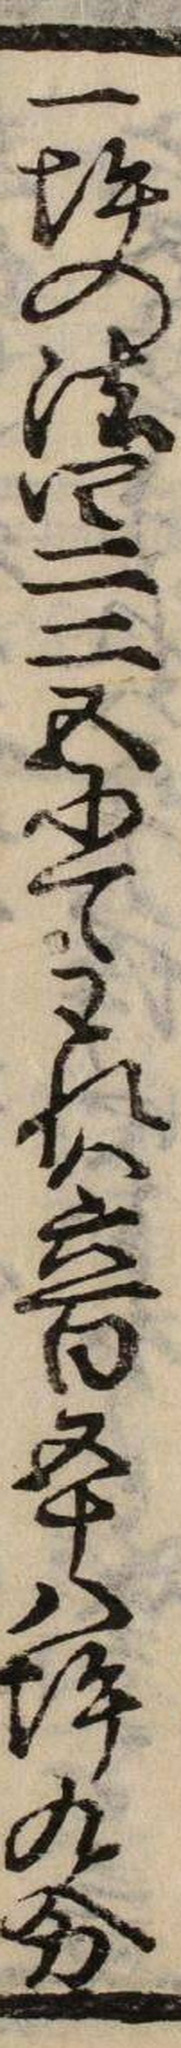一坪の法四二二五にてわれは六百五十八坪九分
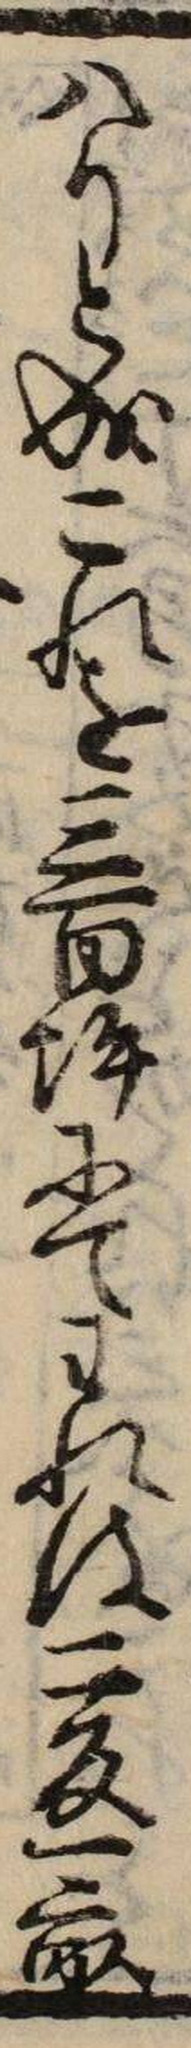八りと成これを三百坪にてわれは二反一畝
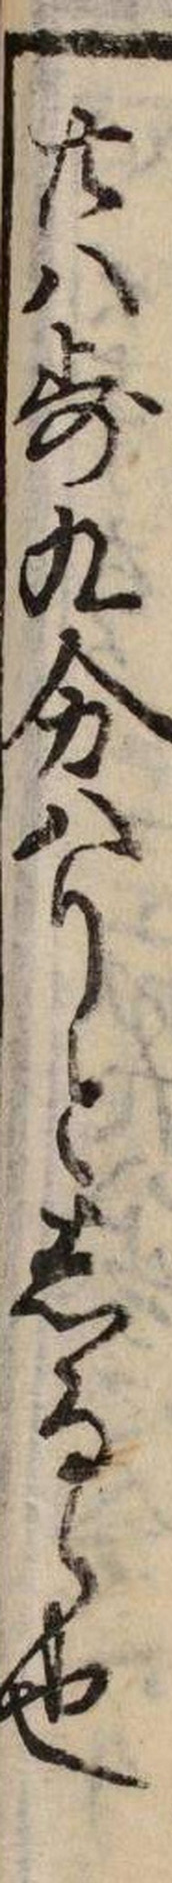廿八歩九分八りとしるる也
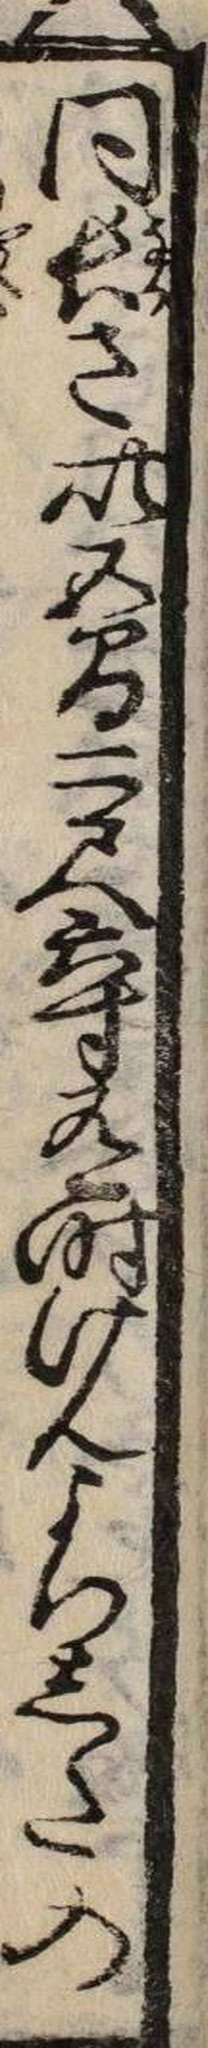△同長さ卅五間二尺六寸有時けんよりしたの
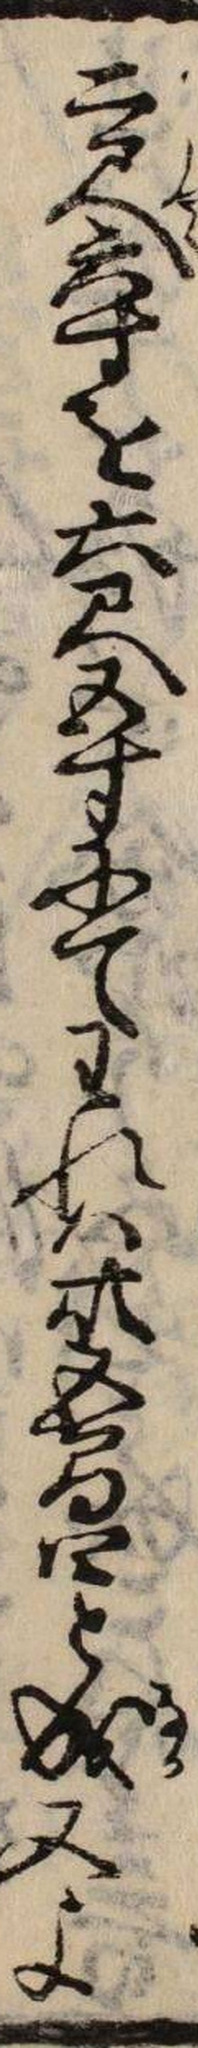二尺六寸を六尺五寸にてわれは廿五間四と成又よ
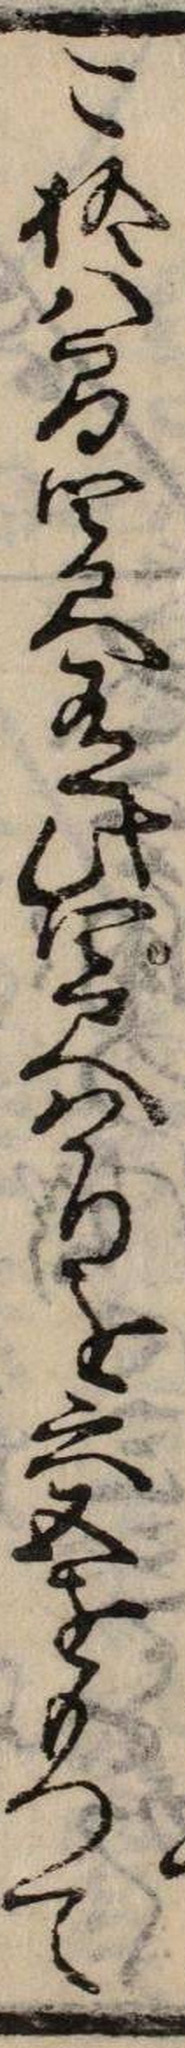こ拾八間四尺有此四尺はかりを六五をもつて
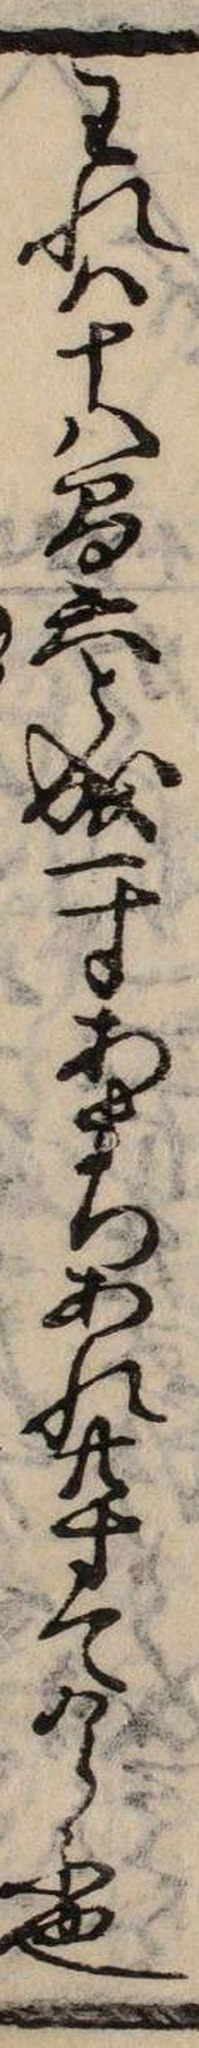われは十八間六と成一寸あまりあれ共すてからふ也
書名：塵劫記（寛永11年自跋、京都府立京都学・歴彩館追貴8）
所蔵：京都府立京都学・歴彩館 国文学研究資料館
